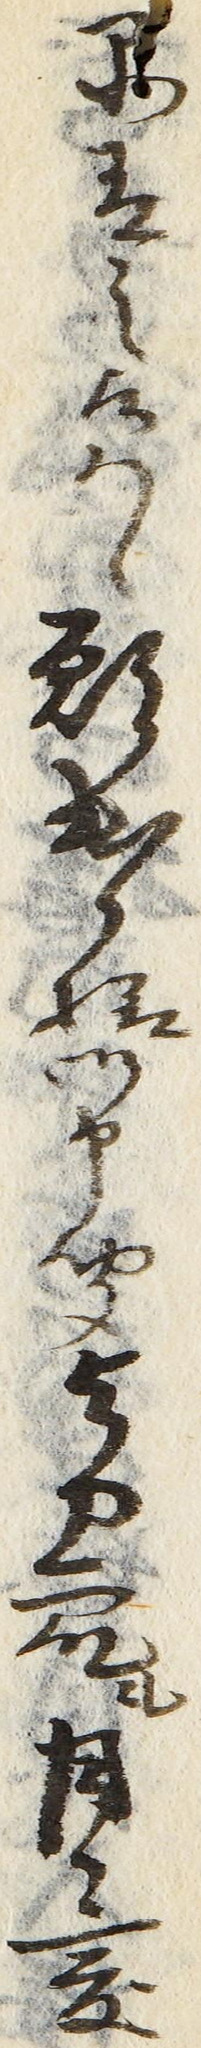品有之候ハヽ願出候様御申聞与力衆も月々一度
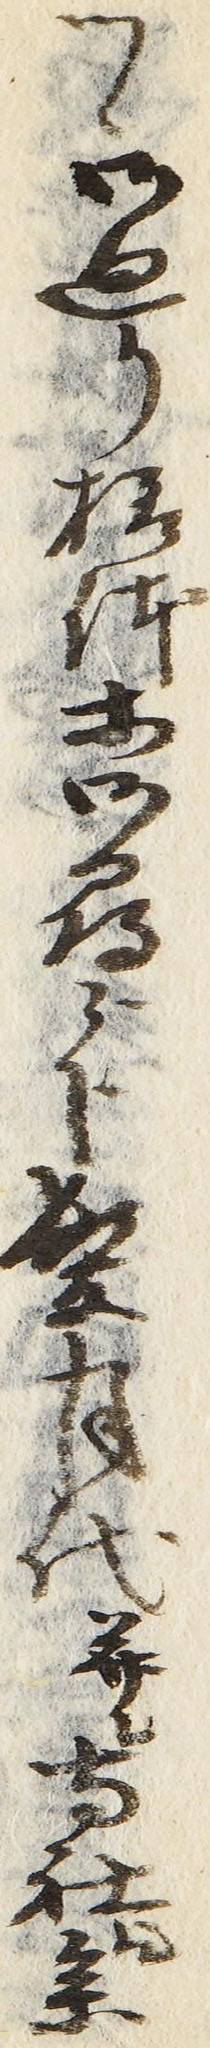ツヽ御廻り様体等御尋被下髪月代幷寺社江参
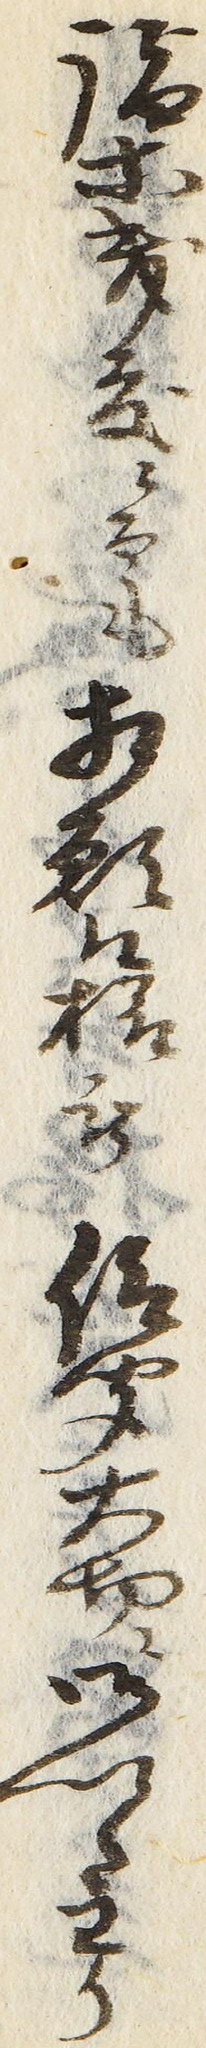詣等幾度ニ而も相願候様被仰聞大切ニ御いたわり
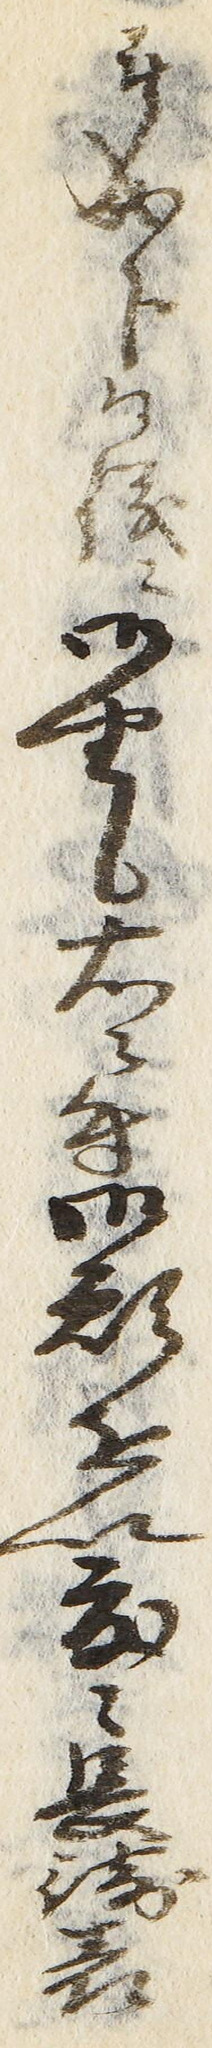被成下候儀ニ御座候右ニ付御願を以度々長崎表
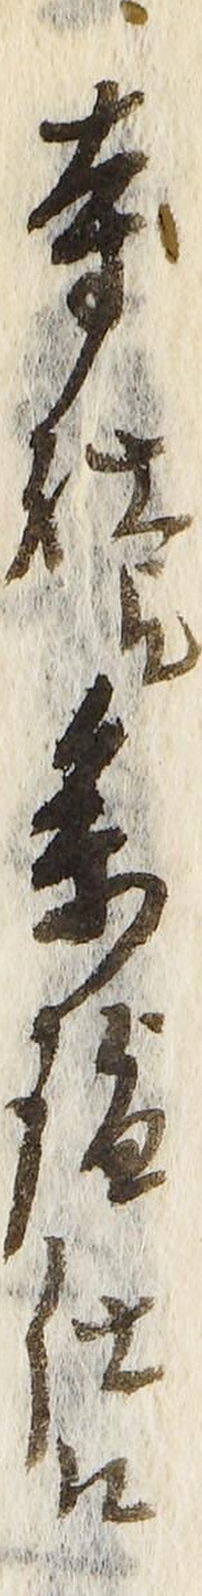寺社江参詣仕候
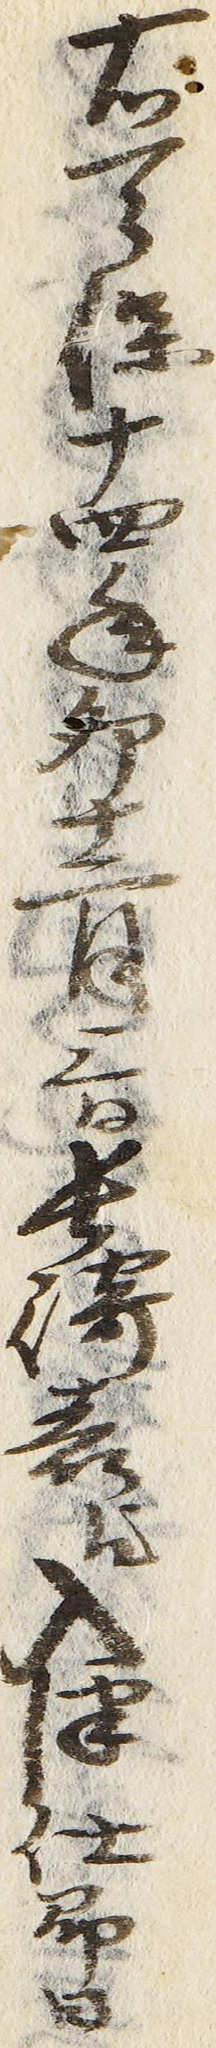右天保十四年卯十二月三日長崎表江入津仕即日
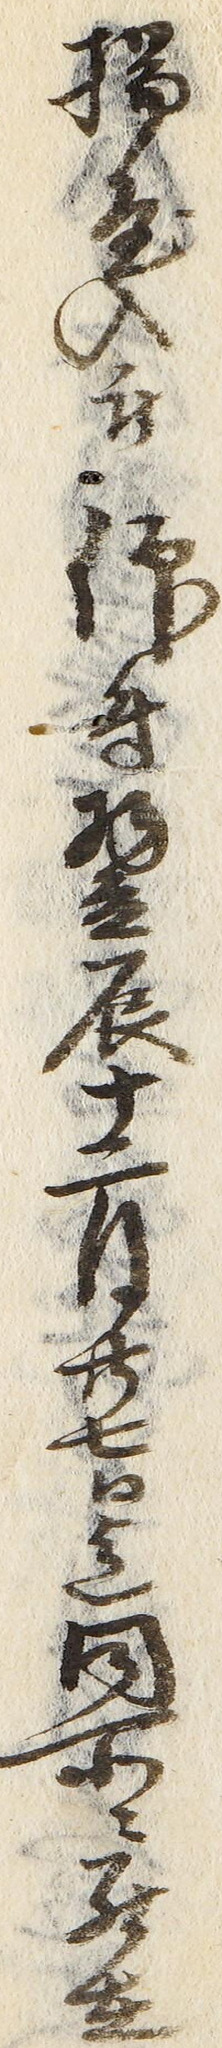揚屋入被仰付翌辰十二月廿七日迄同所ニ罷在
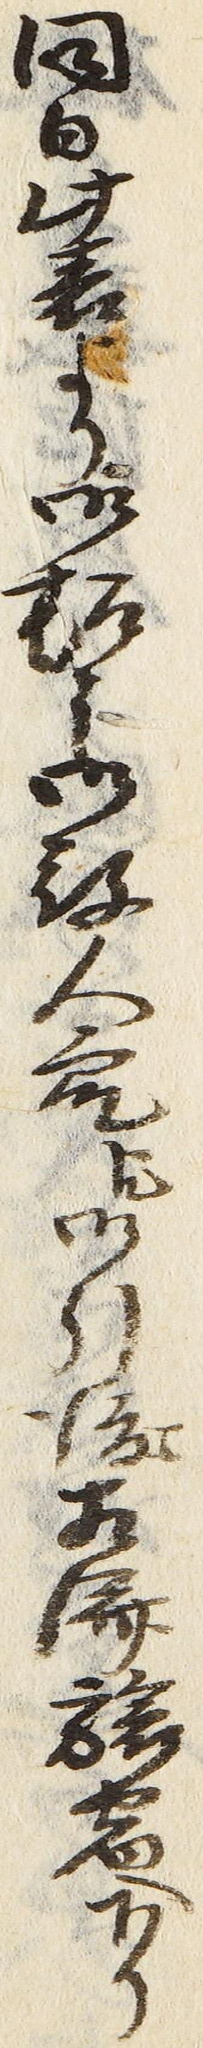同日此表より御趣之御役人衆江御引渡相濟旅宿へ下り
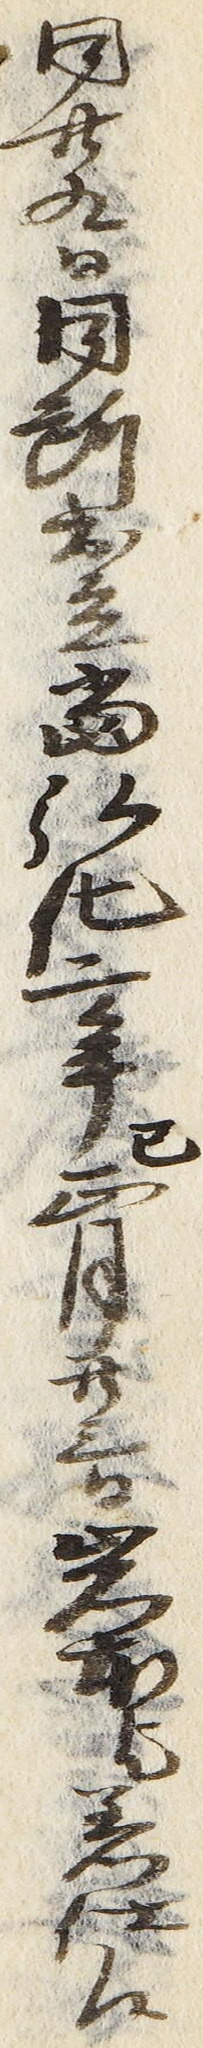同廿九人同所出立當弘化二年巳正月廿三日岩本江着仕候
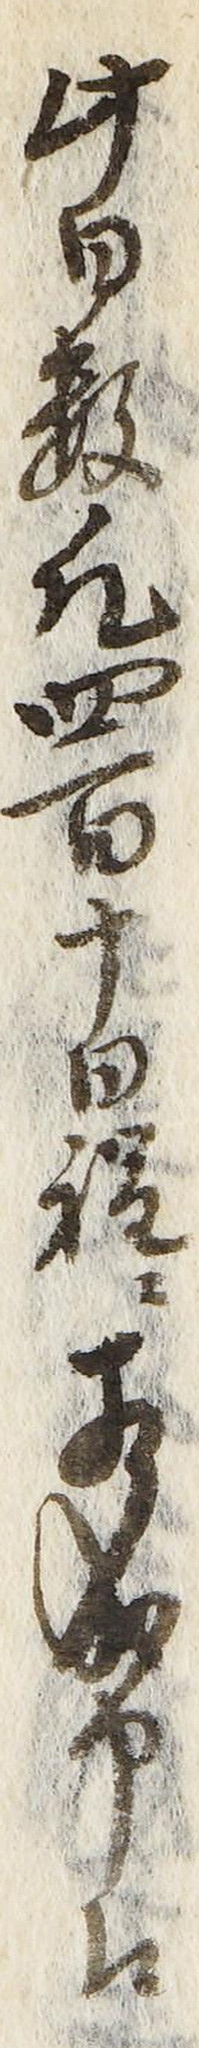此日数凡四百十日程ニ相成申候
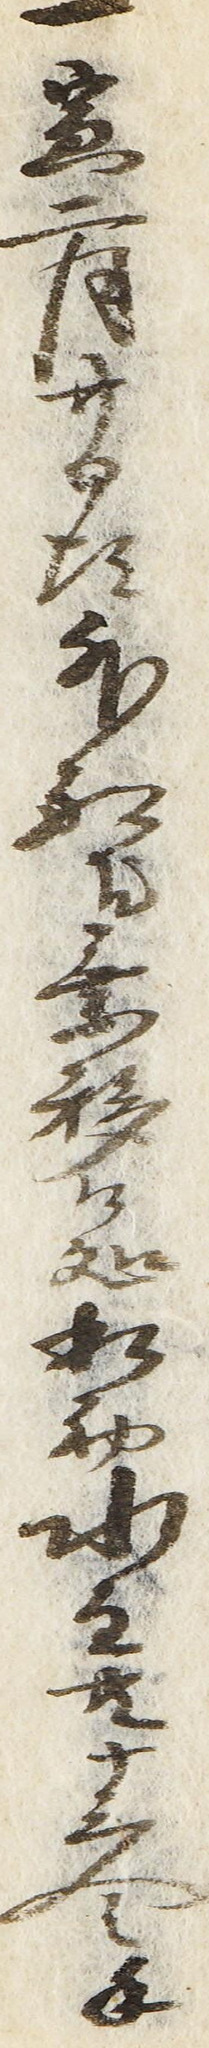一寅二月廿日頃外舩江乗移候処私初水主共十三人之手
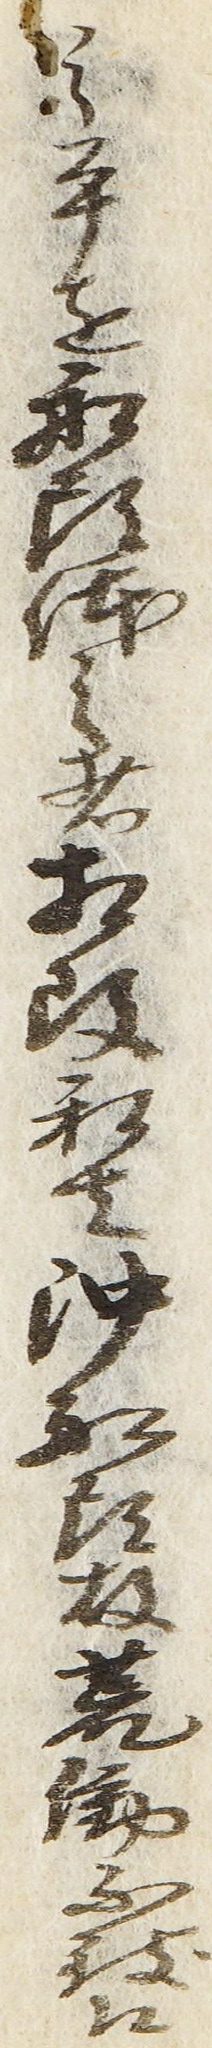之平を舩頭体之者相改私共沖舩頭故荒働不致候
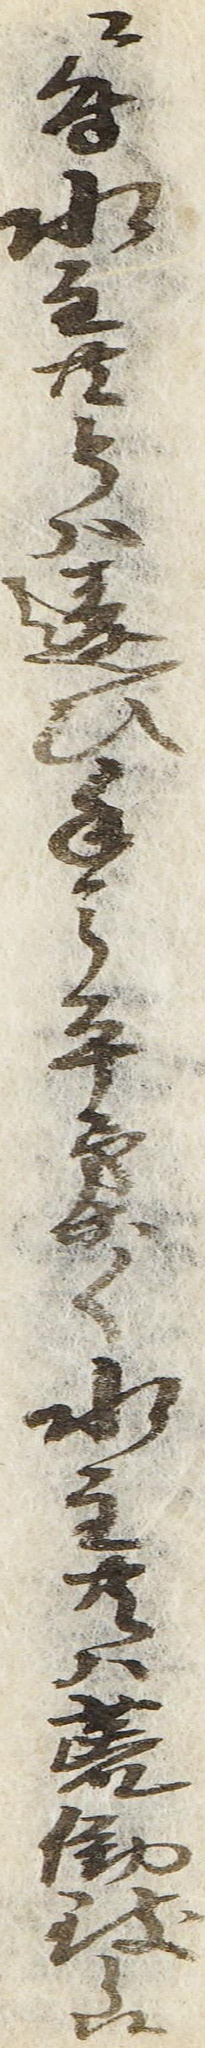ニ付水主共とハ違ひ手之平柔く水主共ハ荒働き致し候
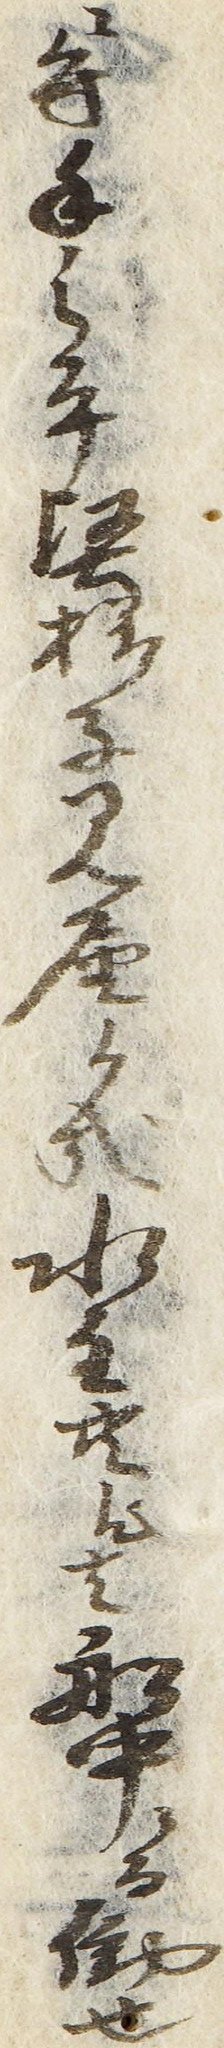ニ付手之平堅様子見届候哉水主共江者舩中ニ而働せ

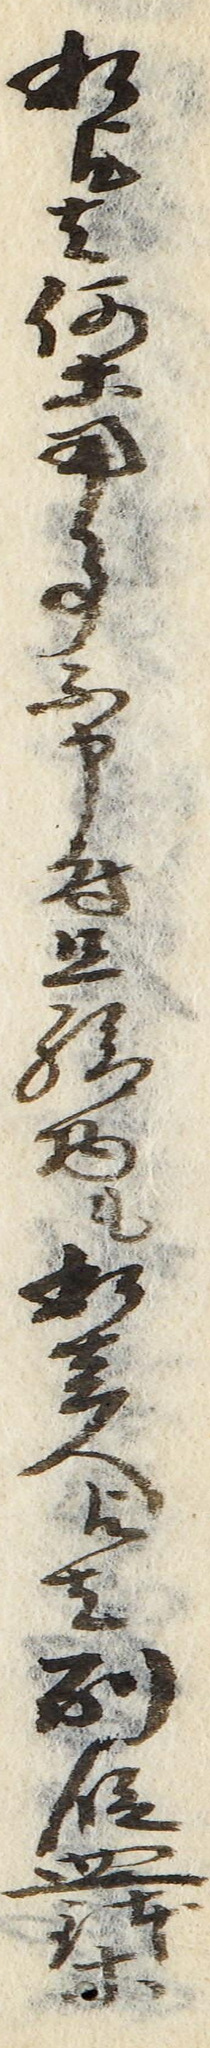私江者何等用事不申付給物も私壱人江者別段皿体等
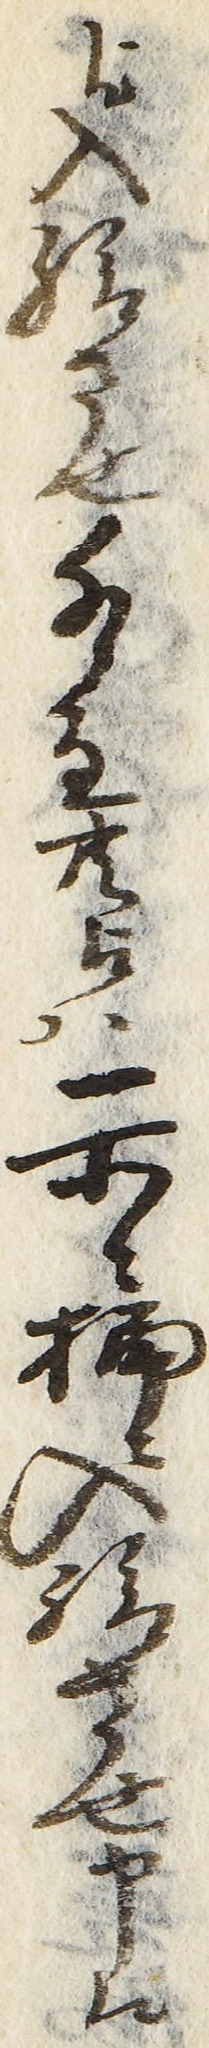江入給させ水主共江ハ一所ニ桶ニ入給させ申候
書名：漂流人善助聞書
